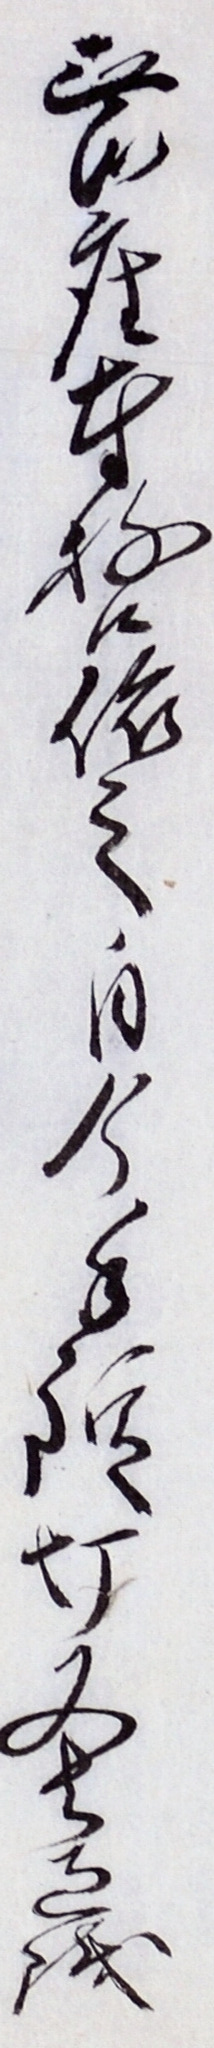無御座奉存候依之自今手錠打又は過銭
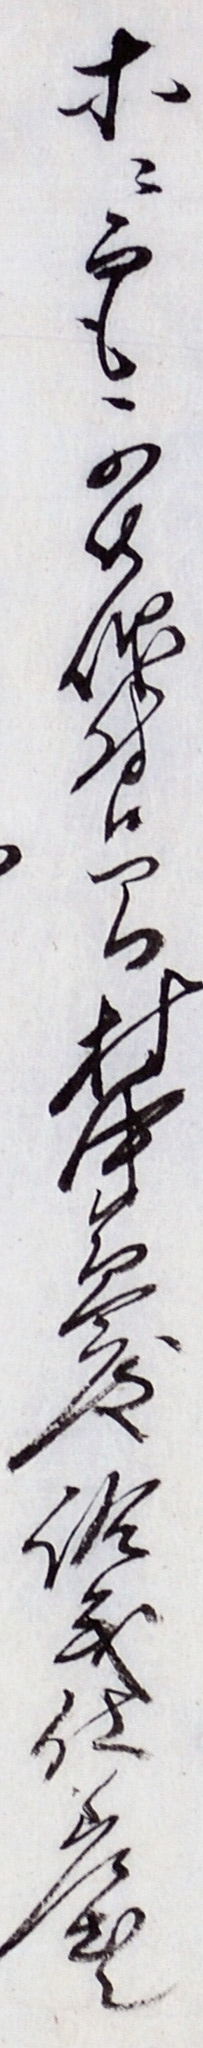等ニ而も可被仰付候間村中急度詮義仕差出し
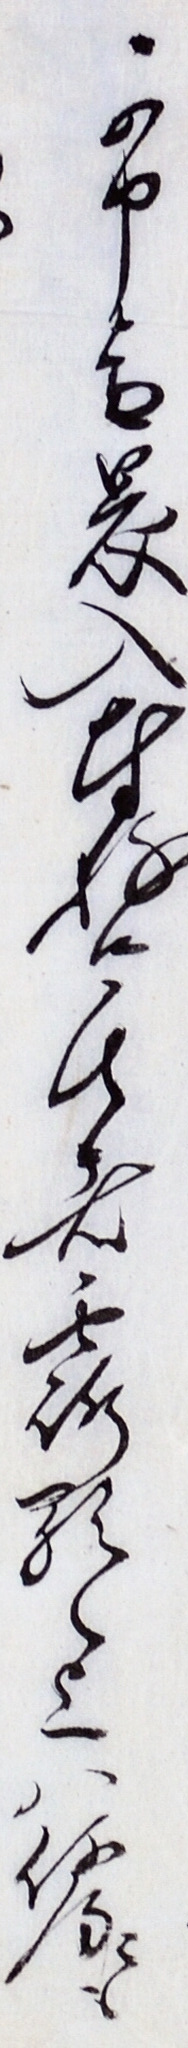可申旨畏入奉存候其者露顕之上ハ何分ニも
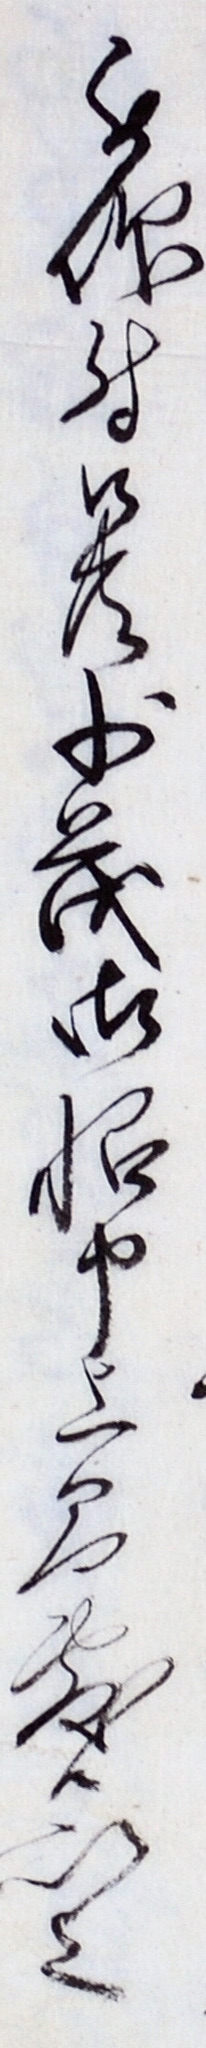被仰付候共少も御恨申上間敷候以上
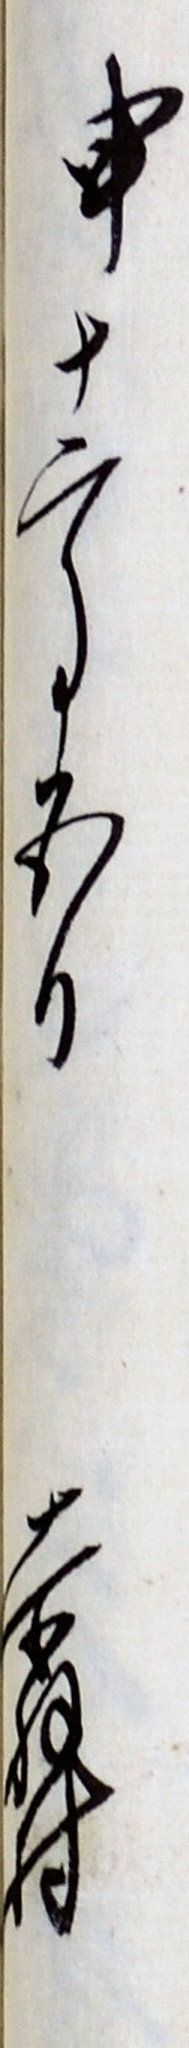申十二月五日赤羽村
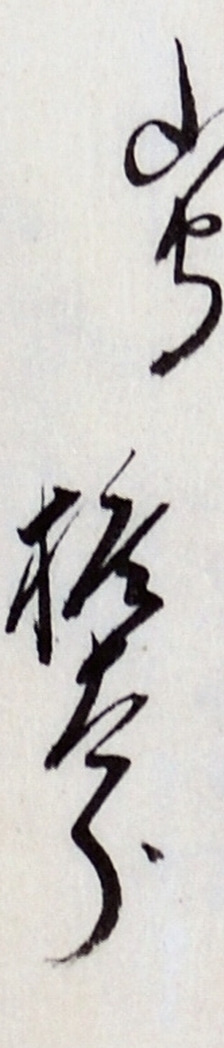権太郎
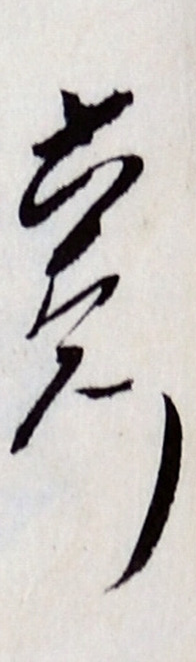六右衛門
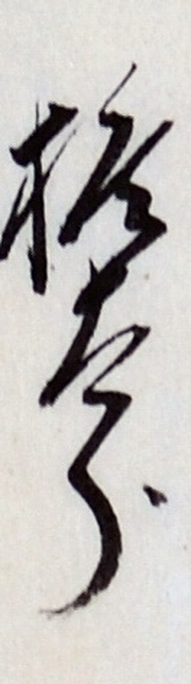権太郎
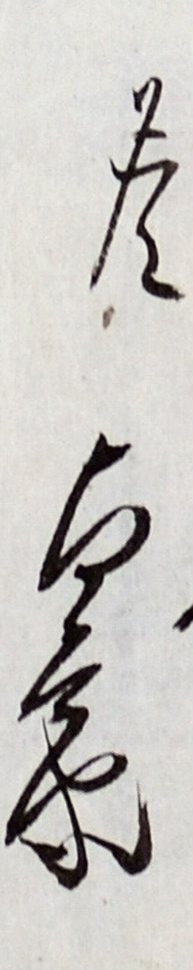六右衛門
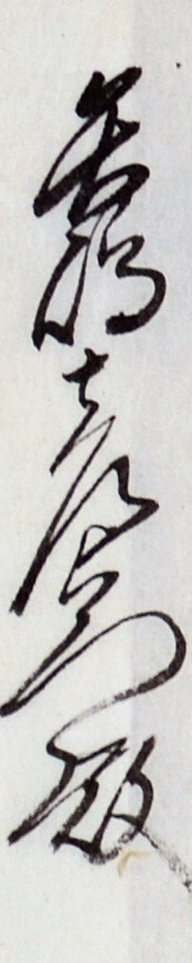矢嶋彦右衛門殿

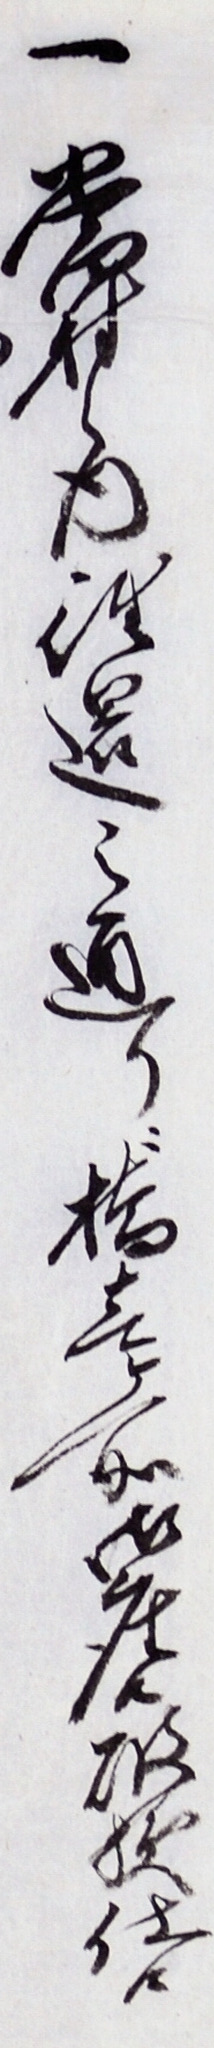一当村之内往還之通りニ橋壱ヶ所御座候破損仕候
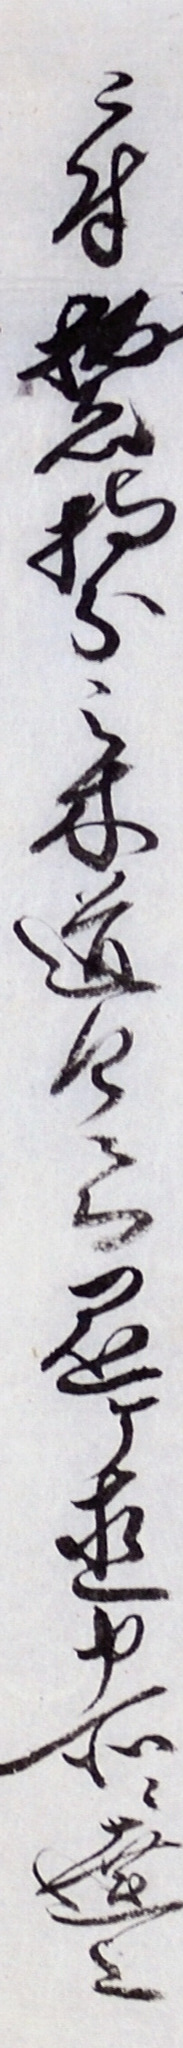ニ付拙者持分之木道具ニ而懸ヶ直申所ニ達迄
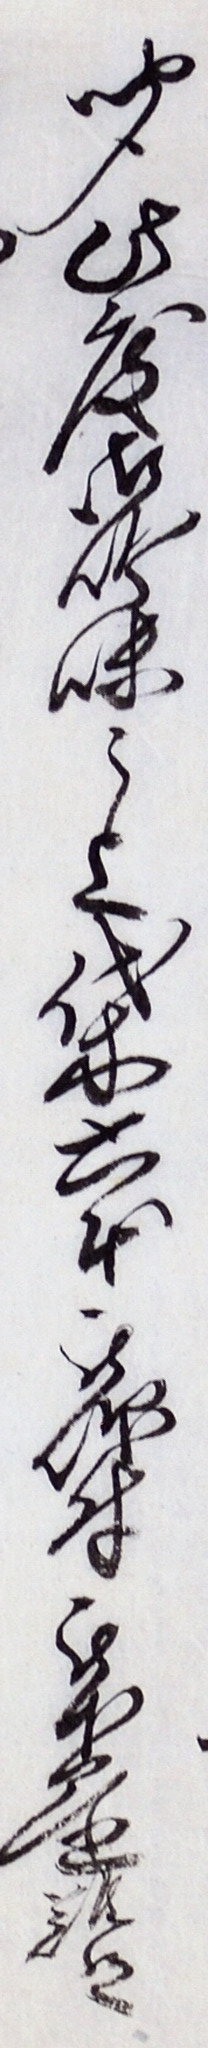聞此度御吟味之上代木六本被仰付被下置難有
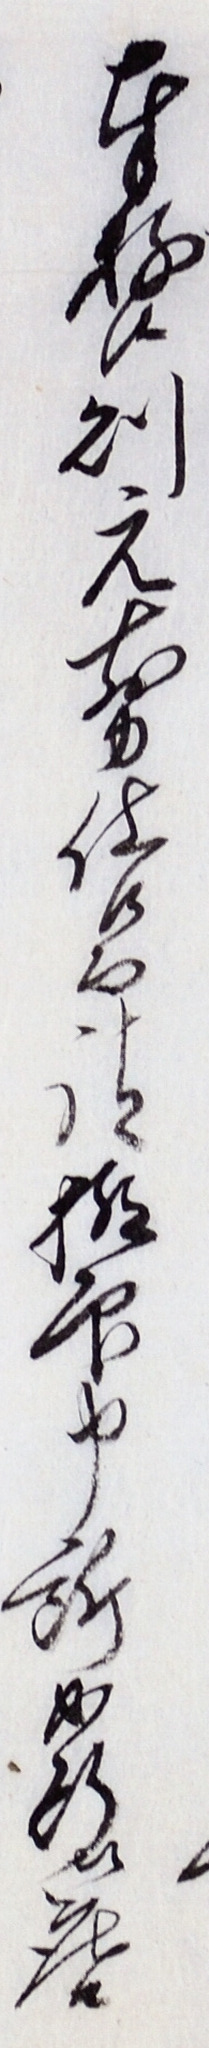奉存候則元剪仕候而請極印申所如斯御座候
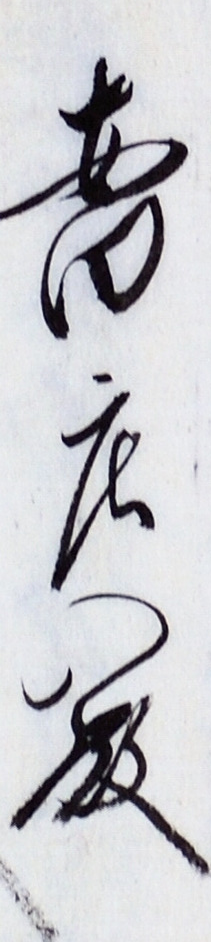安田庄八殿
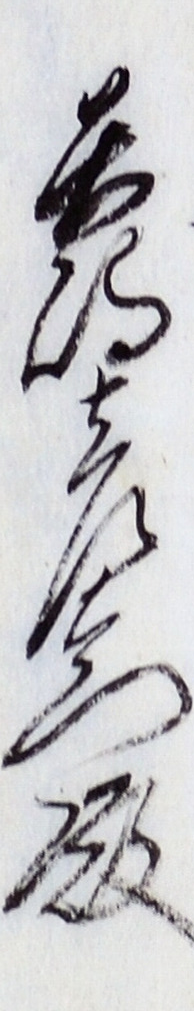矢嶋彦右衛門殿
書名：御林御竹藪証文控
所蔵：伊那市立高遠町図書館・合同会社AMANE
